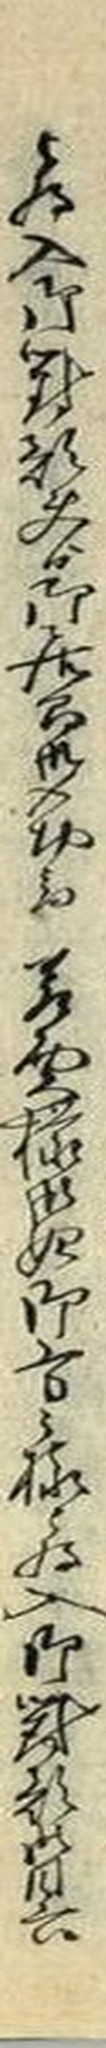被為入御対顔夫ゟ御居間御〆切ニ而若殿様御始御方々様被為入御対顔御目六
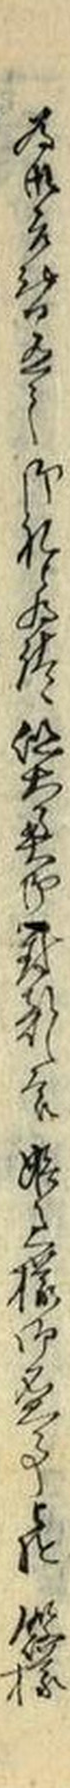為御取替有之御礼被為請候但大奥御対顔之節姫君様御盃事被遊殿様
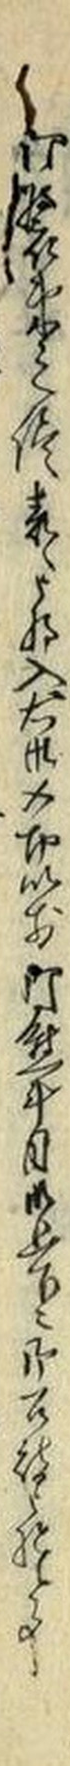御装束之侭表へ被為入右御〆切以前熨斗目御上下ニ御召替被遊候事

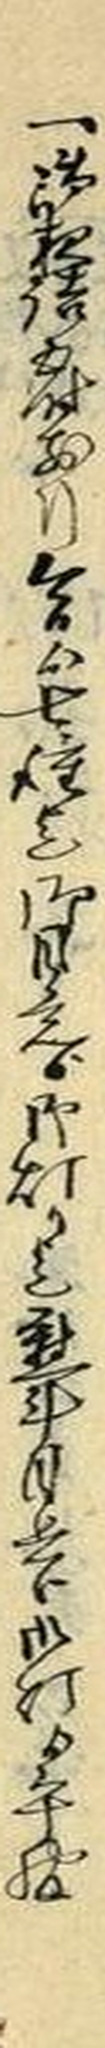一御夜詰五時前引今日ゟ七種迄御目覚ゟ御灯り迄熨斗目上下御灯ゟ平服
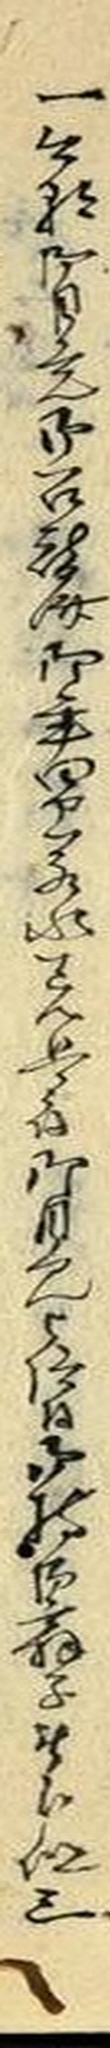一今朝御目覚御召替済御年男若水差上候ニ付御目見被仰付御持御扇子被下但三
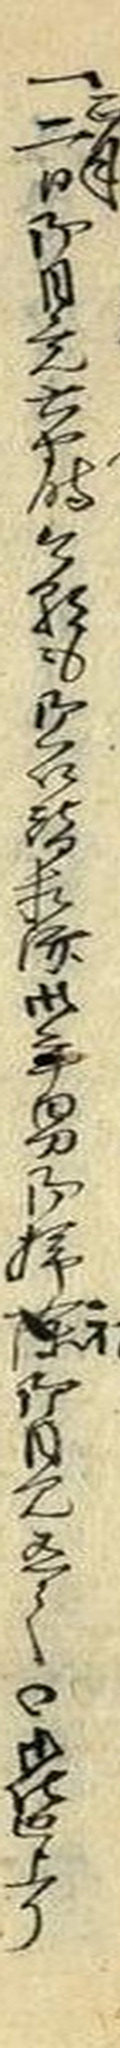一正月二日御目覚六半時今朝も御召替相済御年男御掃初御目見有之○御仕廻上り
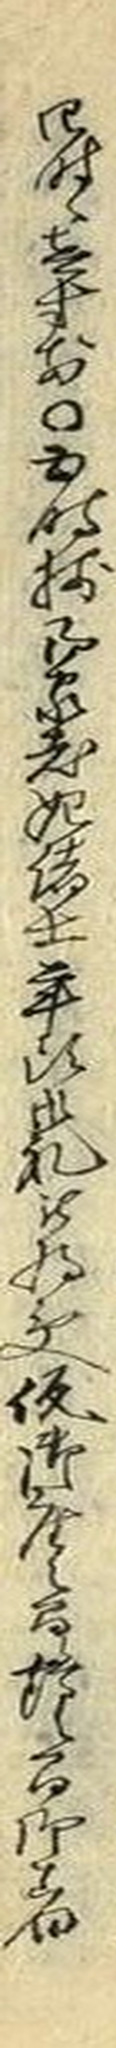四時へ壱寸前○五時揃御家老始諸士年頭御礼被為受仮御座之間鶴之間御着
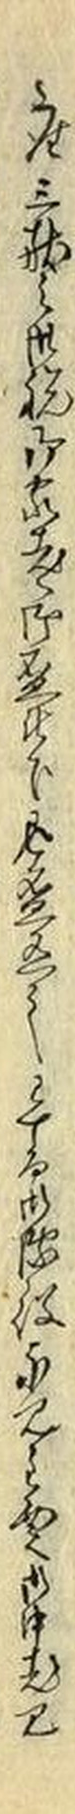座三献之御祝御家老へ御盃被下返杯有之畢而御傅役永見主殿御中老見
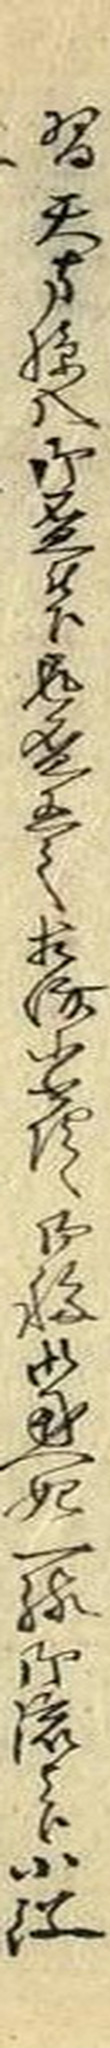習天方孫八御盃被下返杯有之相済小書院へ御移御用人始一統御流被下小役
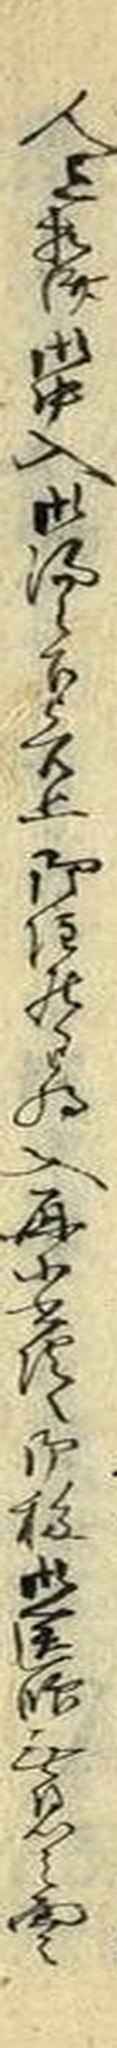人迄相済御中入御湯之下被召上御住居へ被為入再小書院へ御移御医師始無息之面々
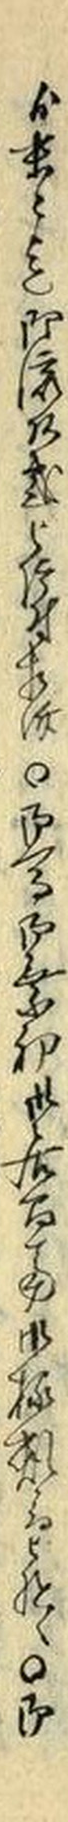ゟ末々迄御流頂戴被仰付相済○御馬御乗初御居間南御縁頬ニ而被遊候○御
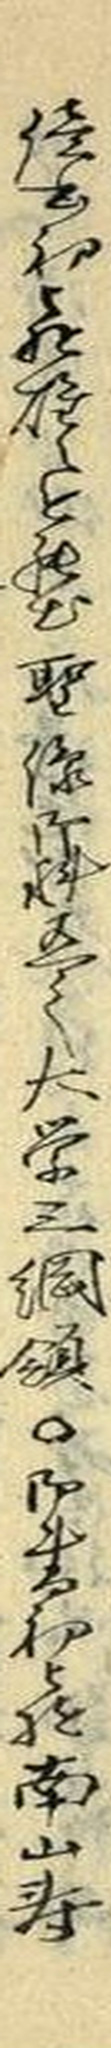読書初被遊雄之進罷出聖像御料有之大学三綱領○御書初被遊南山寿
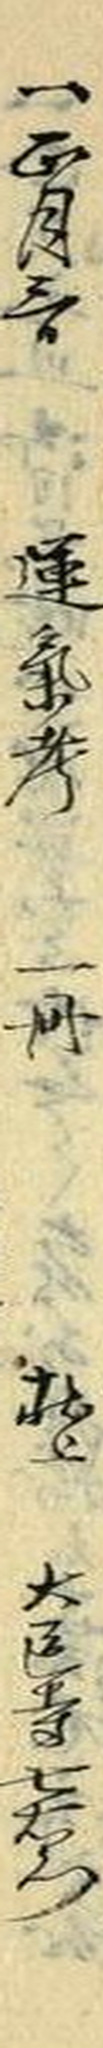一正月三日運気考一冊献上大道寺七右衛門
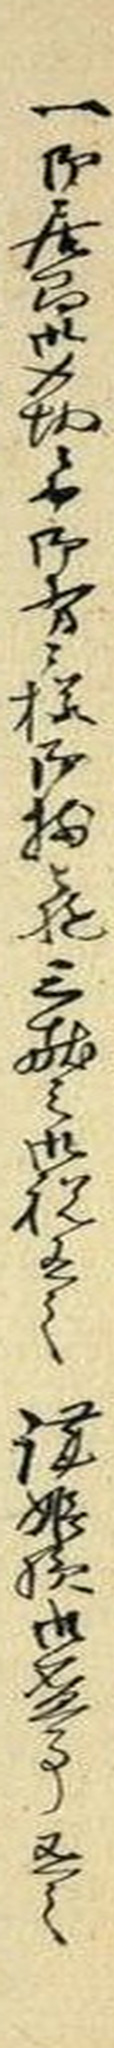一御居間御〆切ニ而御方々様御揃被遊三献之御祝有之謹姫様御盃事有之
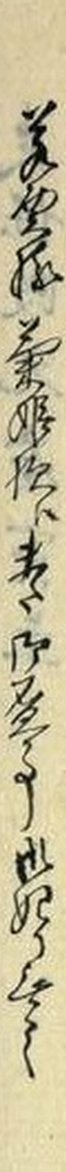若殿様菊姫様ハ未た御盃事御始り無之
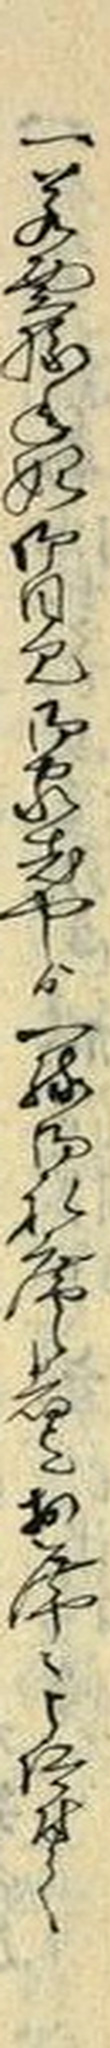一若殿様年始御目見御家老中ゟ一統御礼席之者迄於席々被仰付候
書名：少傅日録抄（斉承付側向頭取日記、在府）
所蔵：福井県文書館 Fukui Prefectural Archives
